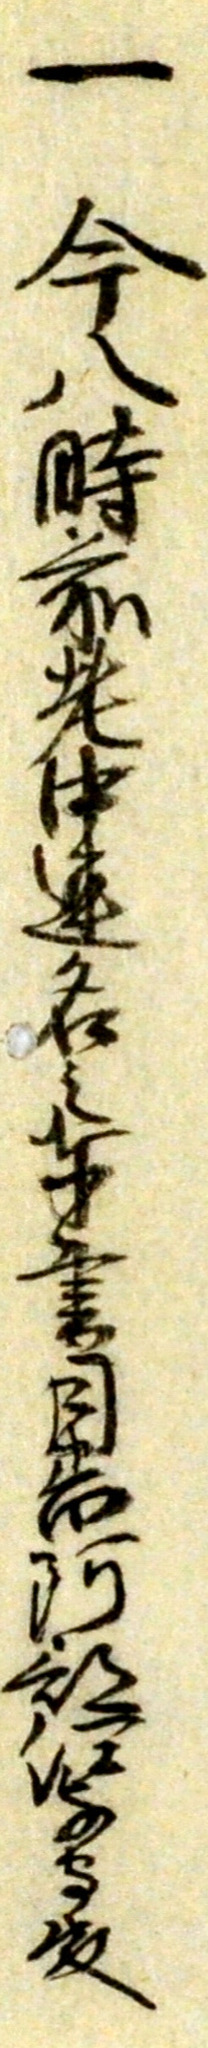一今八時前老中退名之奉書月番阿部伊与守殿
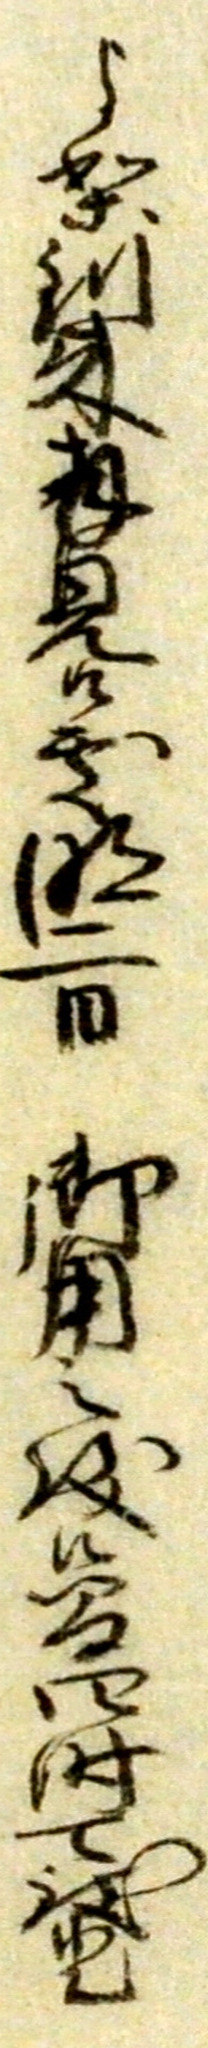より到来拝見候処明二日御用之儀候間四時可致登
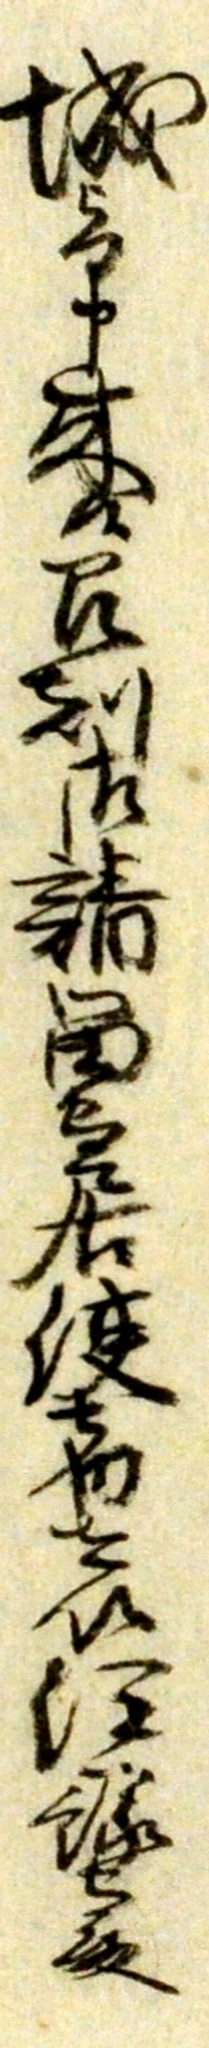城旨申来候即刻御請留守居使者を以伊予守殿
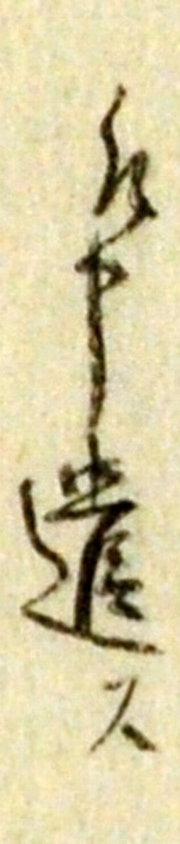江申遣ス
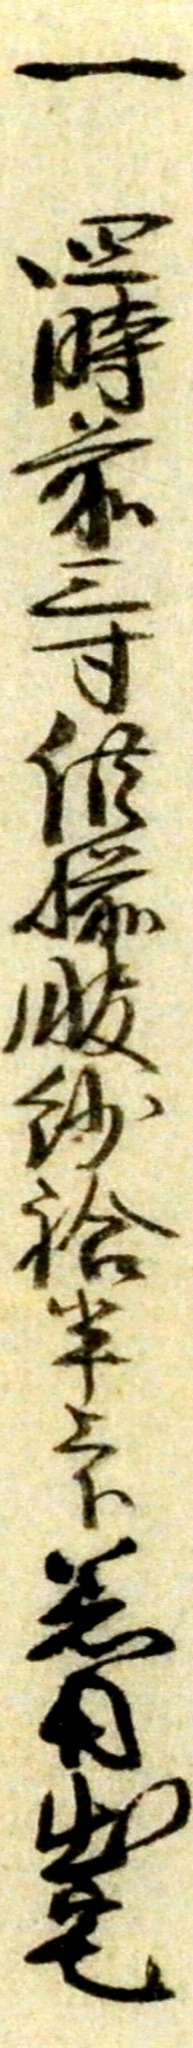一四時前三寸供揃服紗袷半上下着用出宅
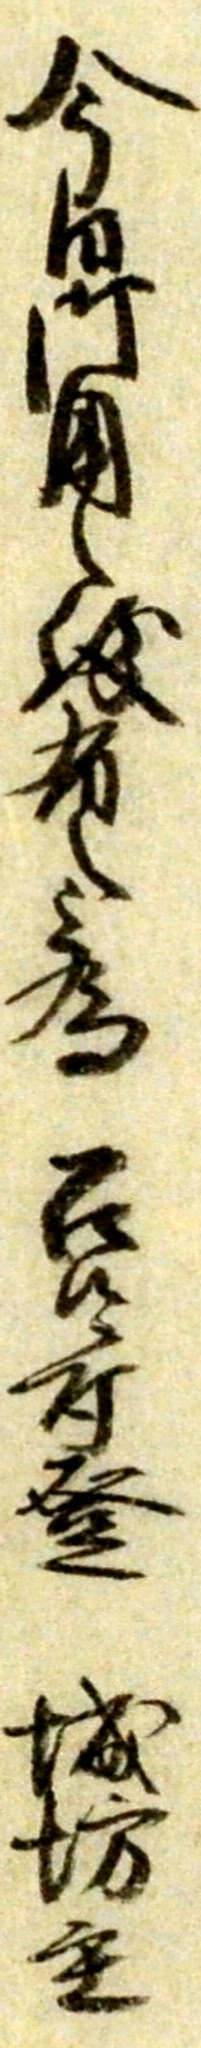今日御用之儀有之為召候ニ付登城坊主
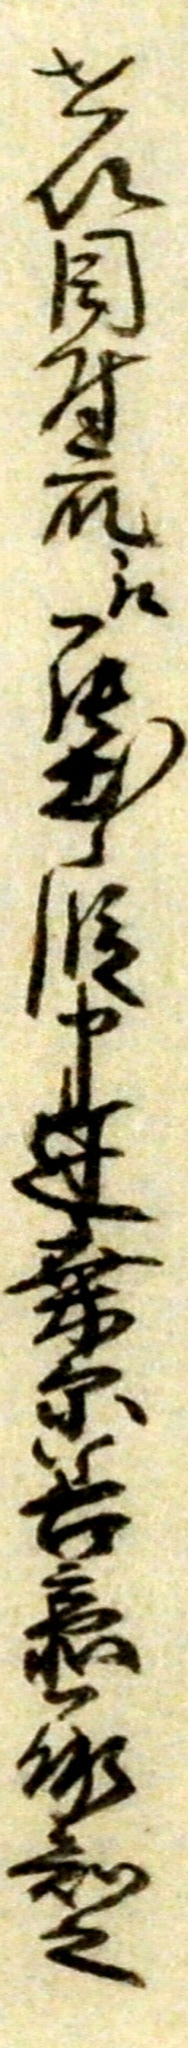を以目付衆江罷出候段申達桑原善兵衛知之
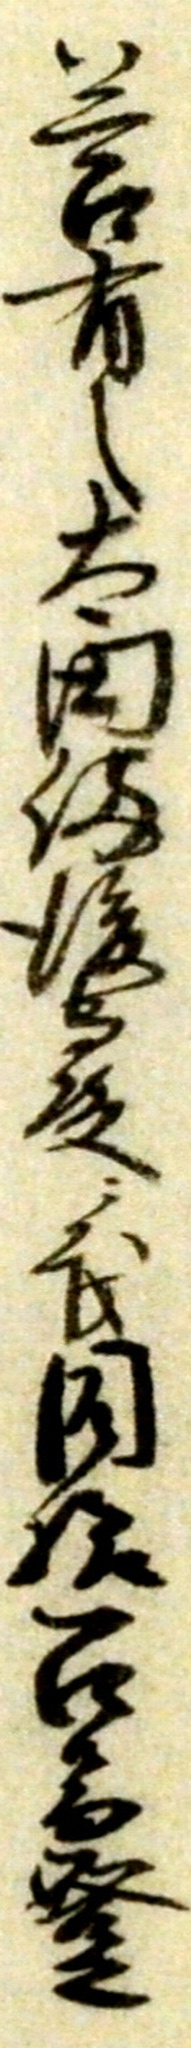答有之大田備後守殿ニ茂同様召ニ而登

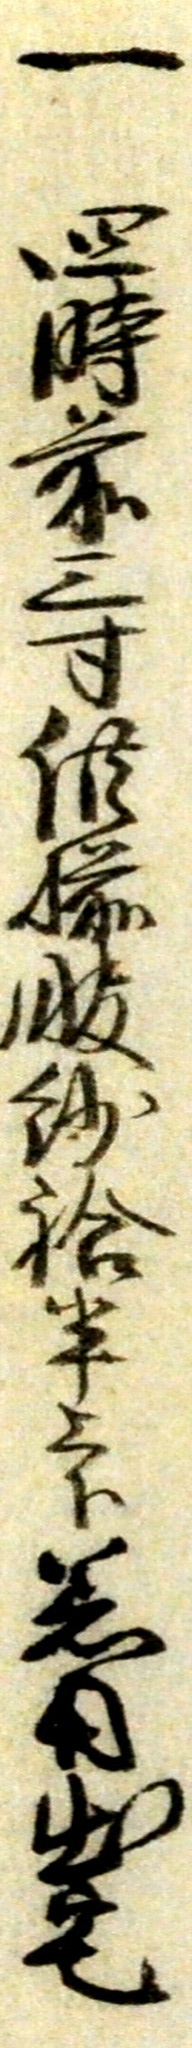一四時前三寸供揃服紗袷半上下着出宅
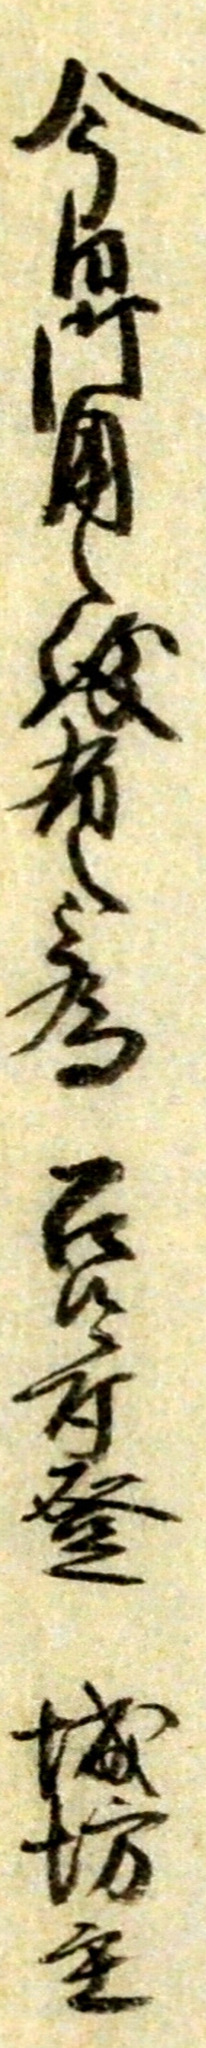今日御用之有之被為召候ニ付登城坊主
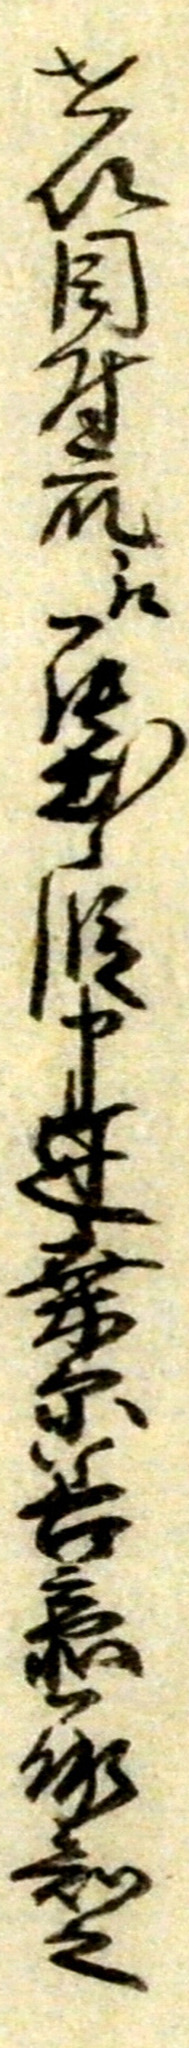を以目付衆罷出候段申達桑原善兵衛知之
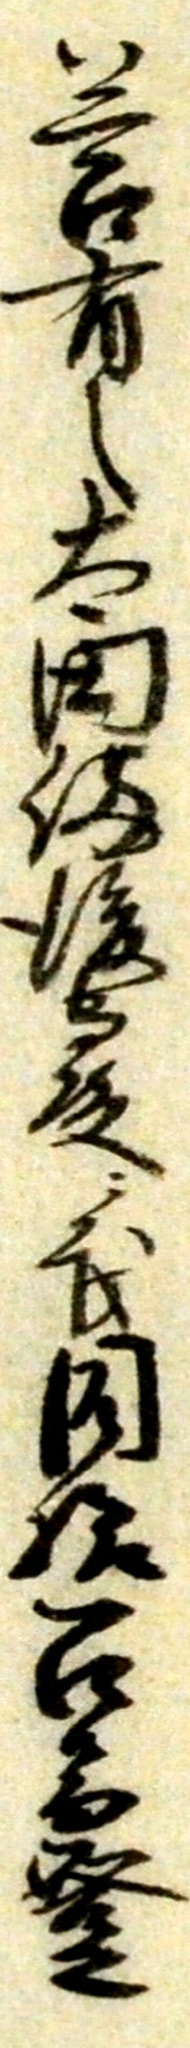答有之太田備後守殿ニ茂同様召候而登
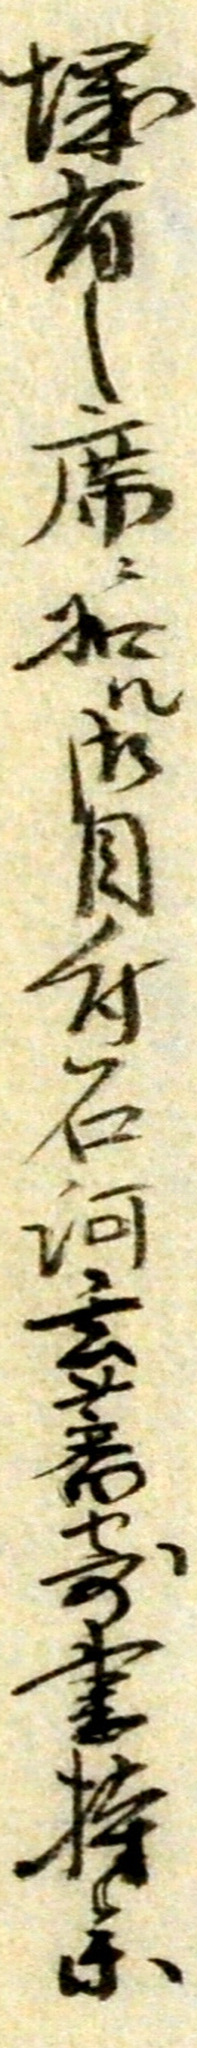城有之席ニ扣ㇽ御目付石河玄蕃寄書持参
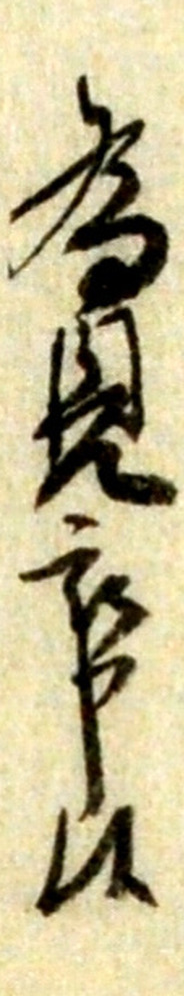為見被申候
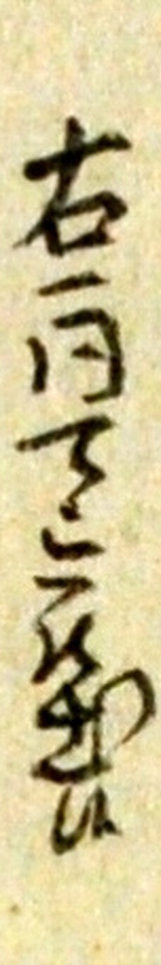右一同可被罷出候
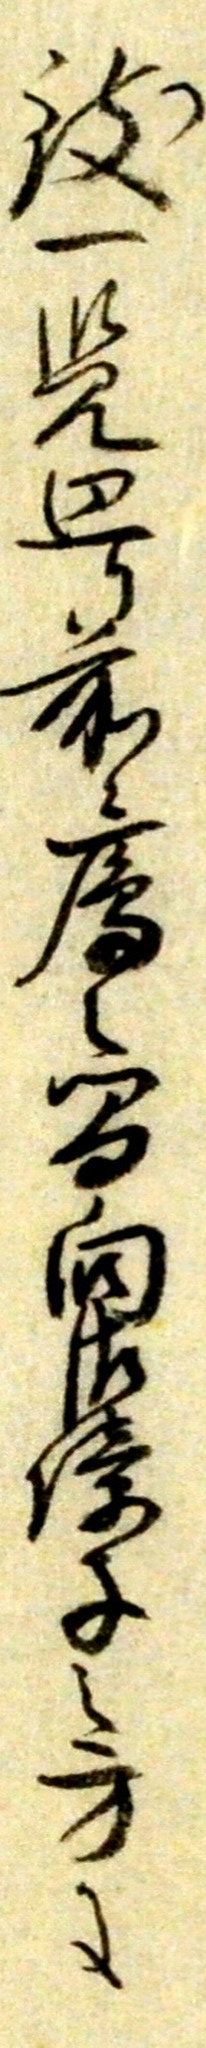致一覧廻り前之雁之間向御障子之方ニ
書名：日光御名代相勤候節ノ留
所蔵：伊那市立高遠町図書館・合同会社AMANE
